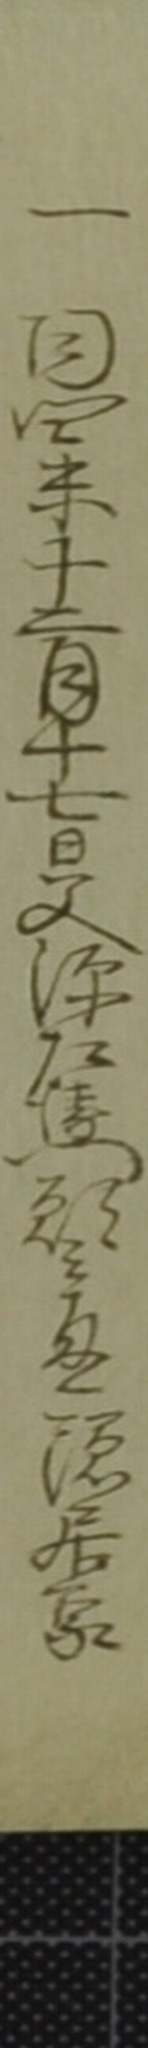一同四未十二月十七日父源左衛門願之通隠居家
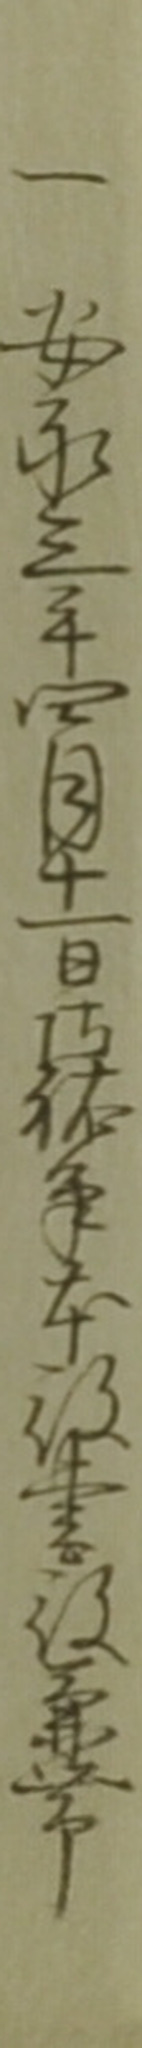一安永三午四月十一日御祐筆本役書役兼帯
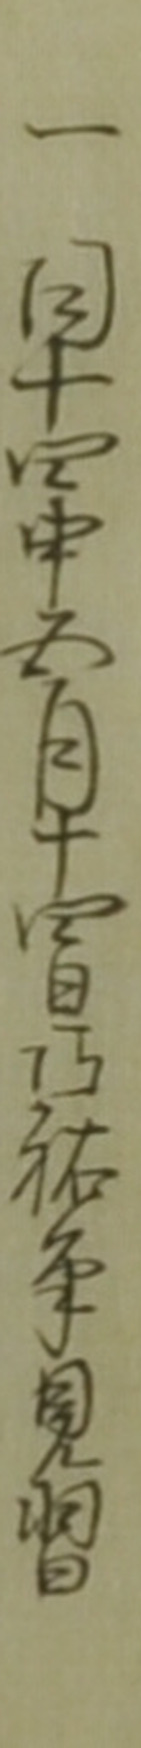一同十四申五月十四日御祐筆見習
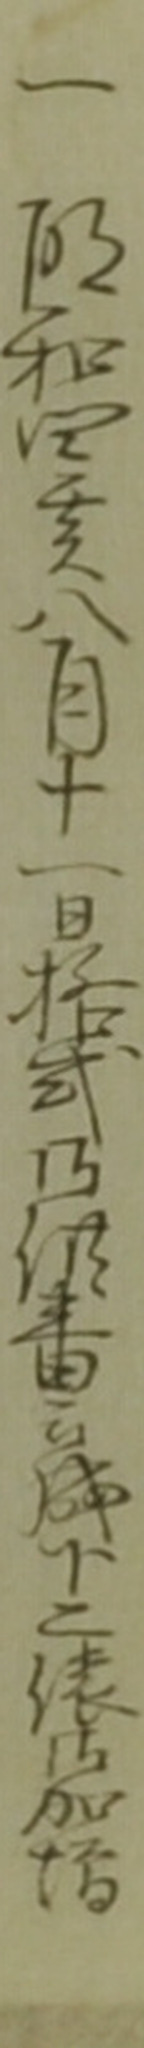一明和四亥八月十一日格式御供番被成下二俵御加増
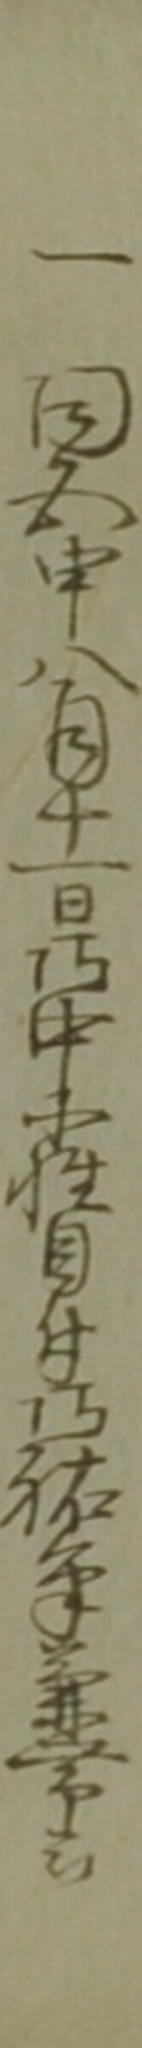一同五申八月十一日御中小性目付御祐筆兼帯被
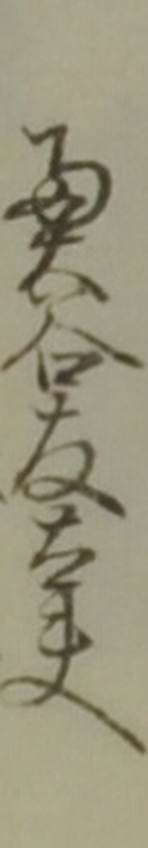奥谷友太夫

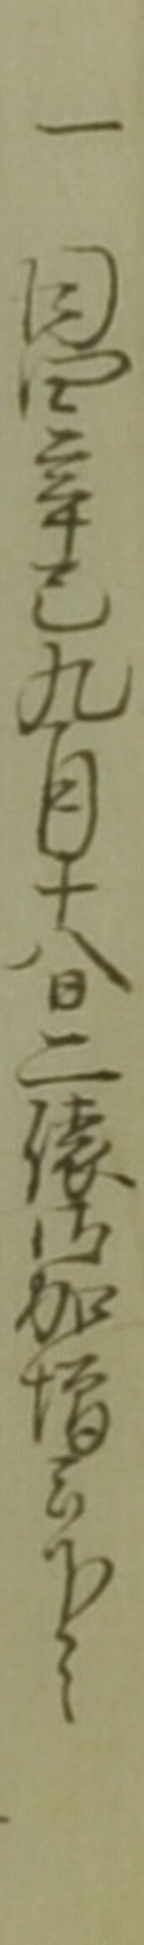一同四辛巳九月十八日ニ俵御加増被下之
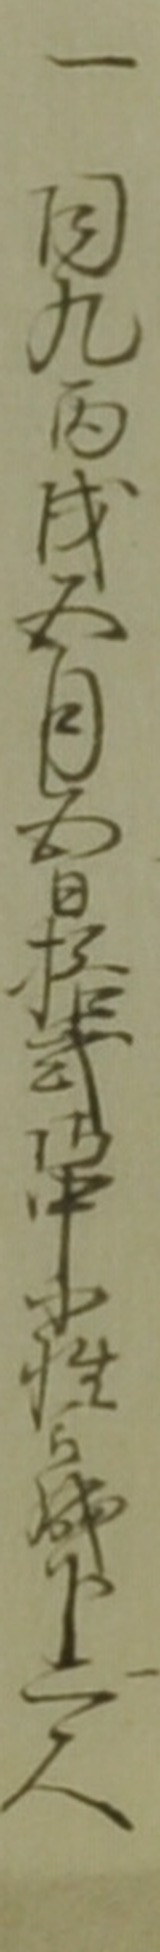一同九丙戌五月五日格式御中小性被成下二人
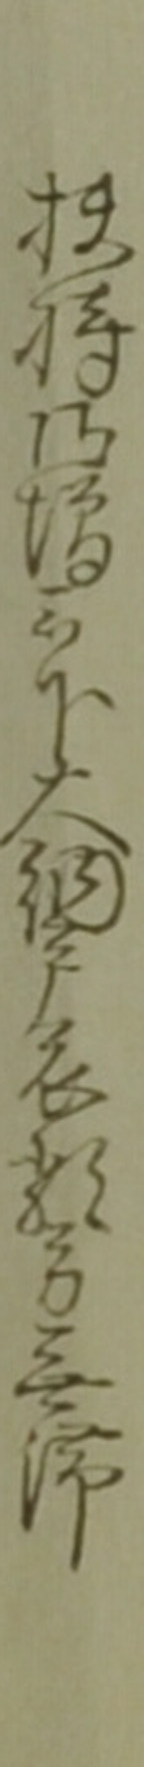扶持御増被下大納戸衣類方無滞
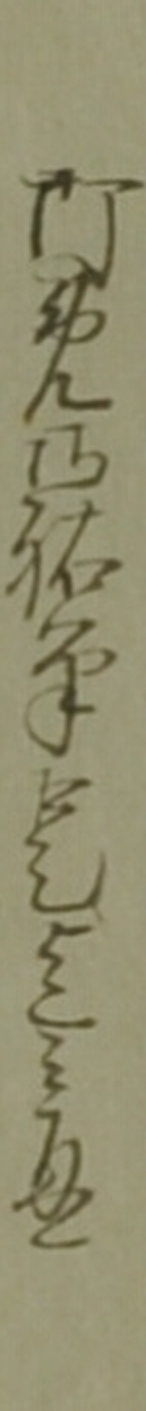御免御祐筆是迄之通
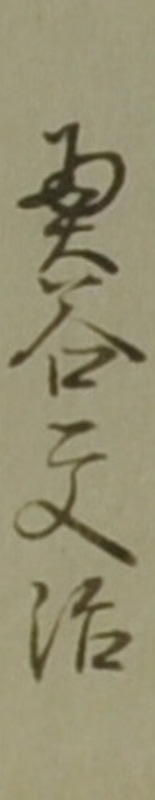奥谷文治
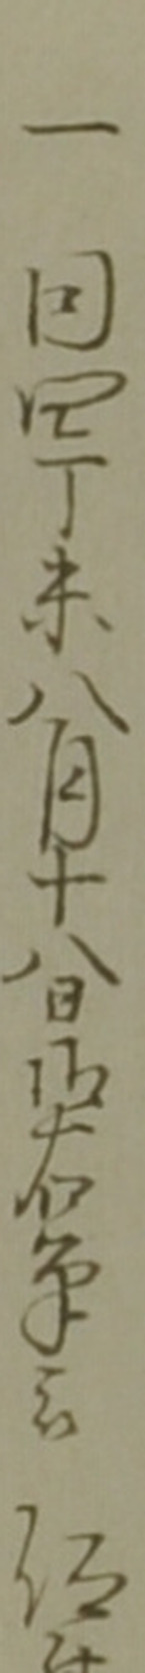一同四丁未八月十八日御右筆被仰付
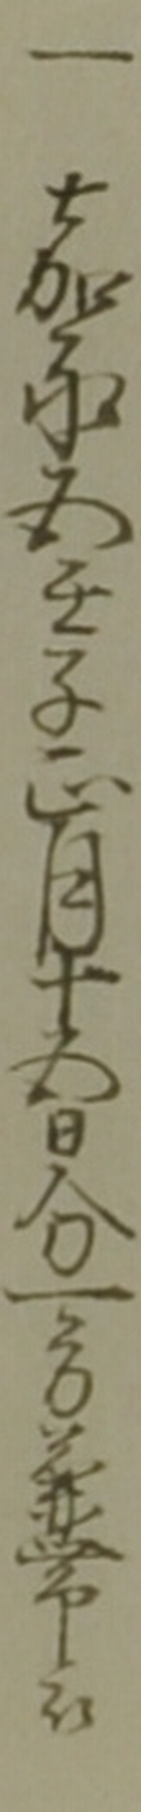一嘉永五壬子正月十五日分一方兼帯被

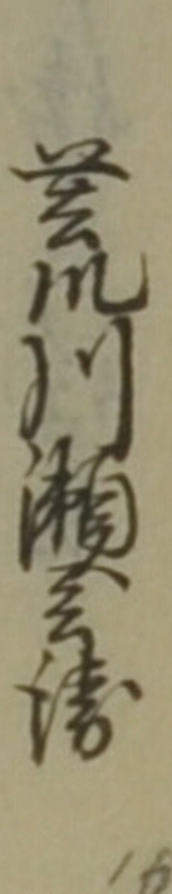荒川瀬兵衛
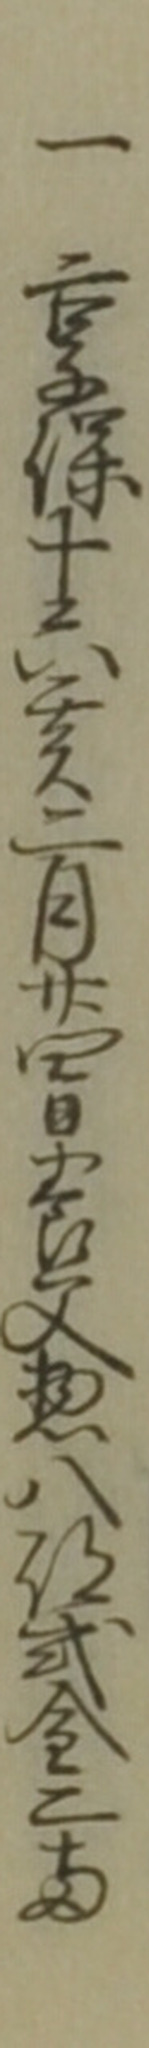一享保十六亥二月廿四日養父惣八跡式金二両
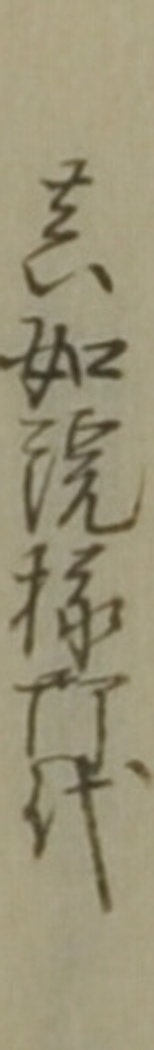真如院様御代
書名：無足諸士勤仕録（二）
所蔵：伊那市立高遠町図書館・合同会社AMANE
